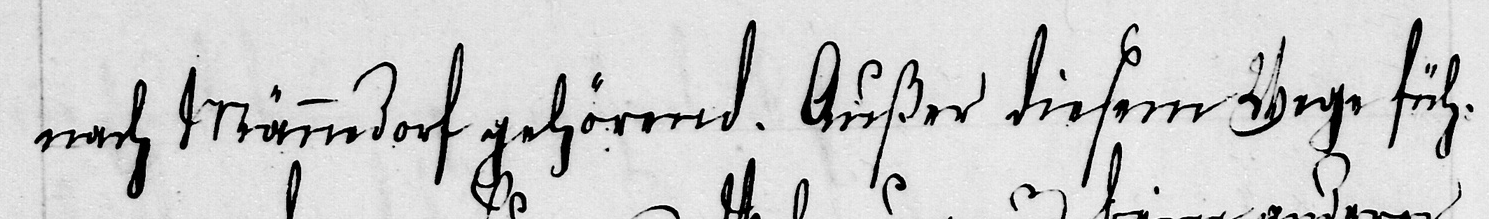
nach Männedorf gehörend. Außer diesem Wege füh¬
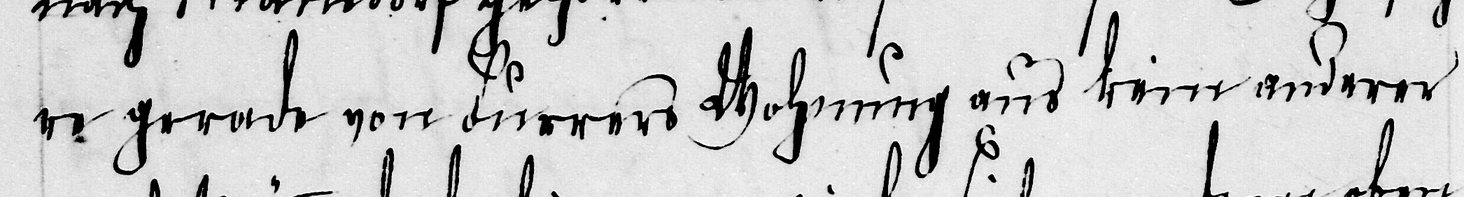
re gerade von Furrers Wohnung aus kein anderer
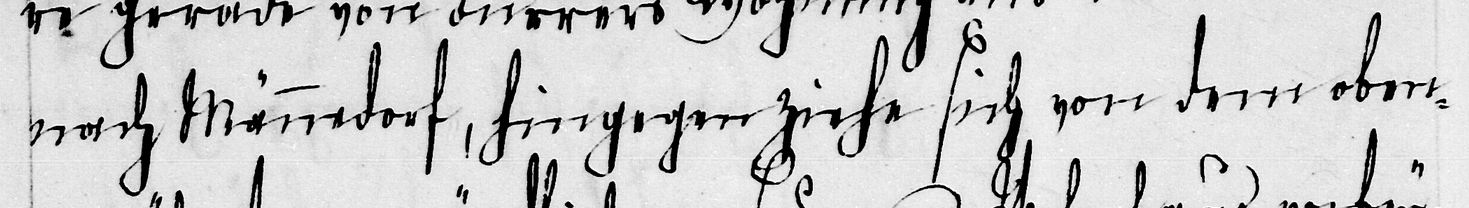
nach Männedorf, hingegen ziehe sich von dem oben¬
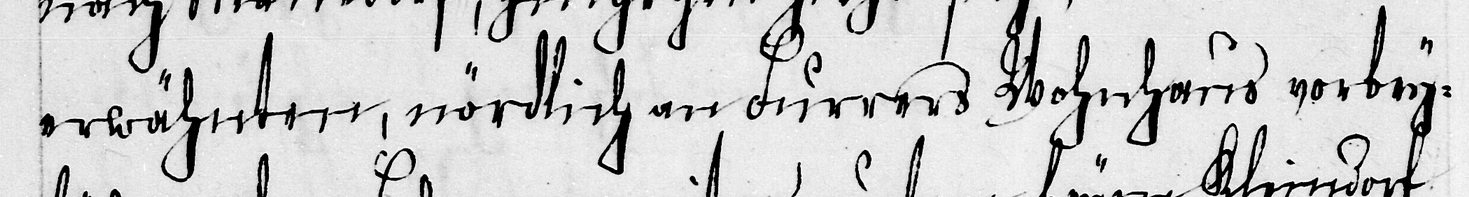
erwähnten, nördlich an Furrers Wohnhaus vorbey¬
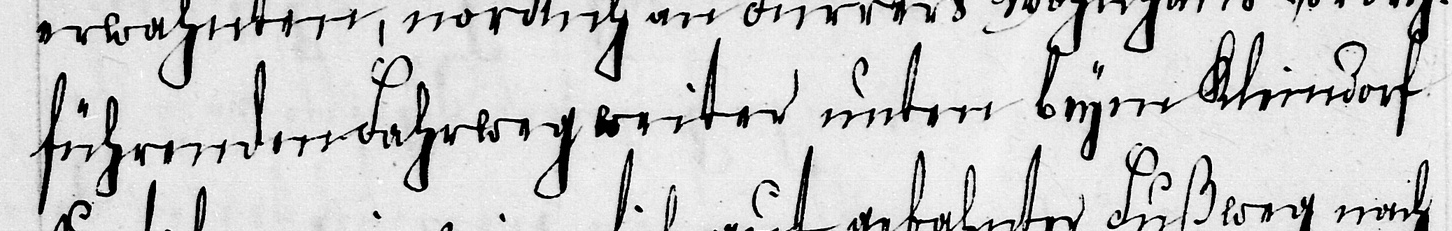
führenden Fahrweg weiter unten beym Kleindorf
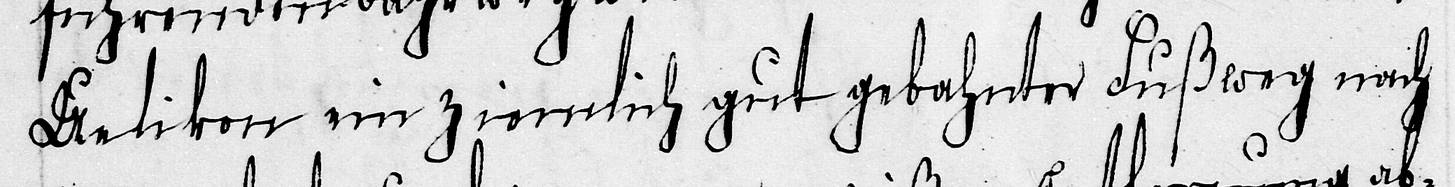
Uetikon ein ziemlich gut gebahnter Fußweg nach
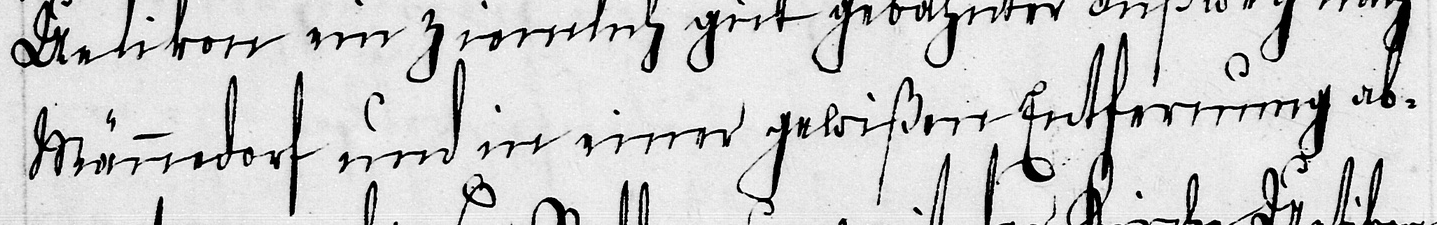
Männedorf und in einer gewißen Entfernung ab¬
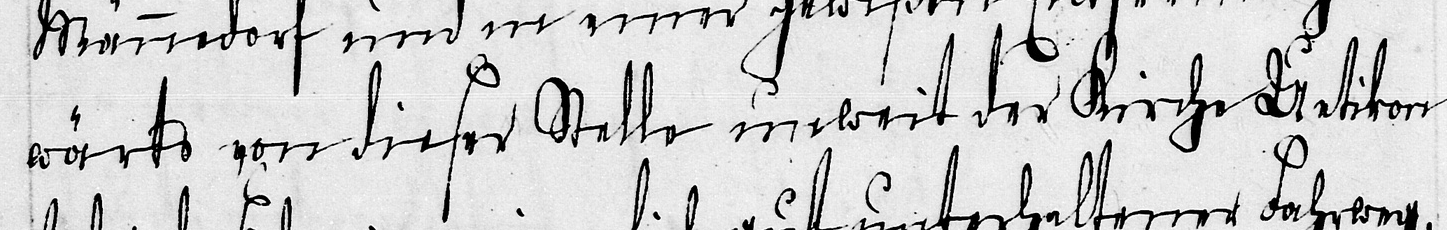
wärts von dieser Stelle unweit der Kirche Uetikon
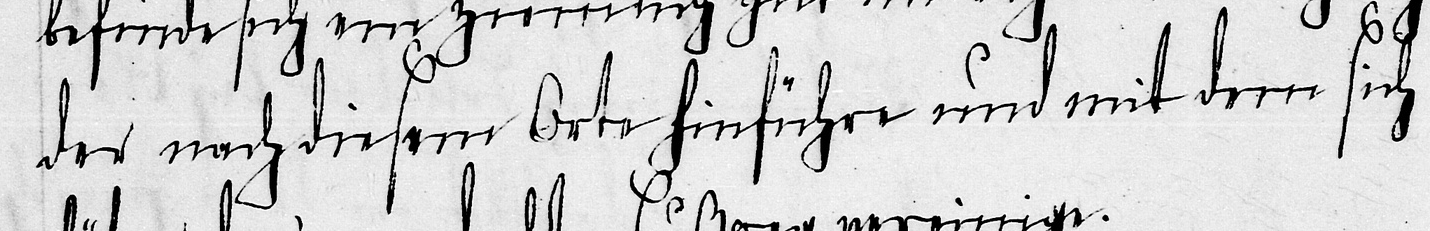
der nach diesem Orte hinführe und mit dem sich
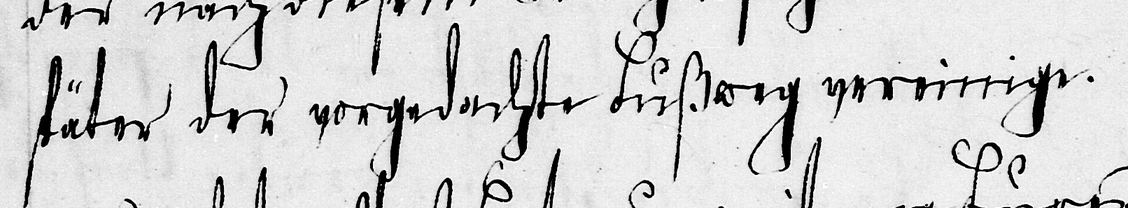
später der vorgedachte Fußweg vereinige.
